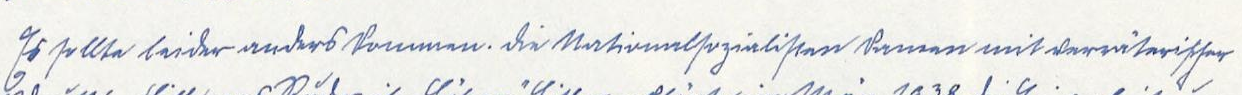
Es sollte leider anderes kommen. Die Nationalsozialisten kamen mit verräterischer
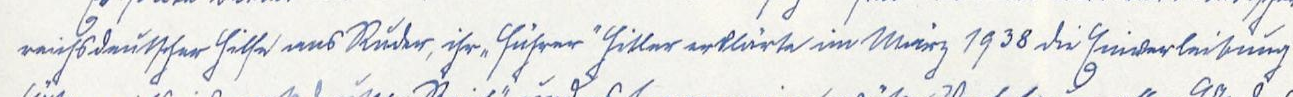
reichsdeutscher Hilfe ans Ruder, ihr Führer Hitler erklärte im März 1938 die Einverleibung
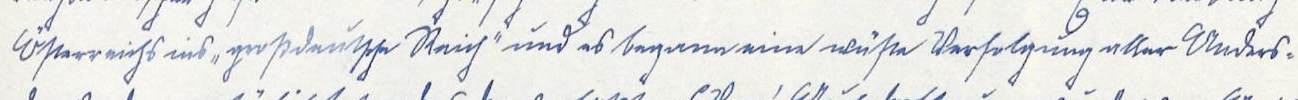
Österreichs "ins großdeutsche Reich" und es begann eine wüßte Verfolgung aller Anders-
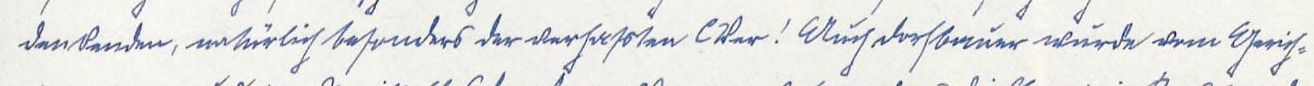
denkenden, natürlich besonders der verhaßten CVer! Auch Dorfbauer wurde vom Gerich-
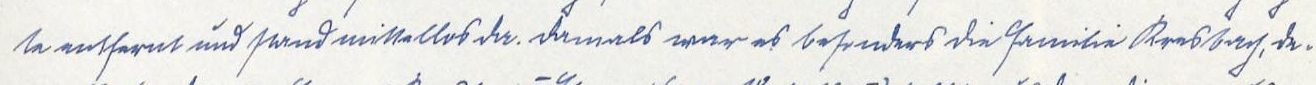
te entfernt und stand mittellos da. Damals war es besonders die Familie Kresbach, de-
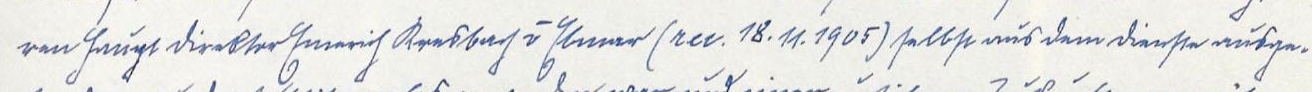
ren Haupt Direktor Emerich Kresbach v/o Elmar (rez. 18. 11. 1905) selbst aus dem Dienste ausge-
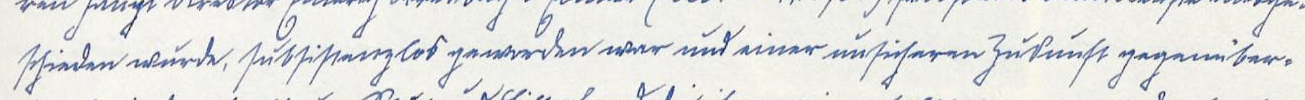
geschieden wurde, subsistenzlos geworden war und einer unsicheren Zukunft gegenüber-
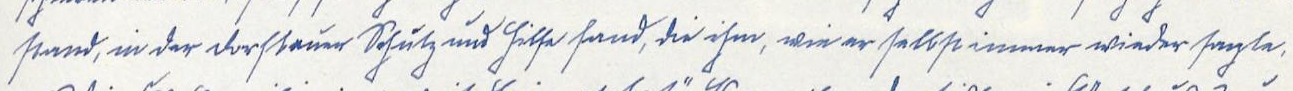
stand, in der Dorfbauer Schutz und Hilfe fand, die ihm, wie er selbst immer wieder sagte,
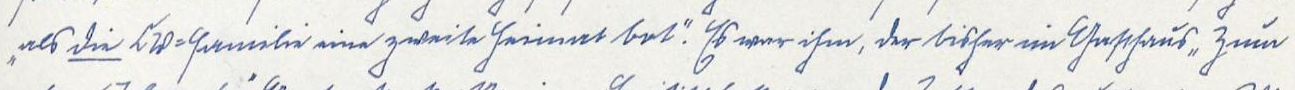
als die CV- Familie eine zweite Heimat bot. Es war ihm, der bisher im Gasthaus "Zum
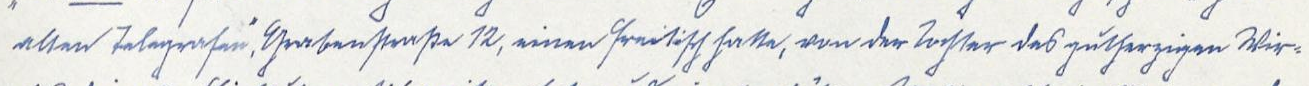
alten Telegrafen", Grabenstraße 1, einen Freitisch hatte, von der Tochter des gutherzigen Wir-
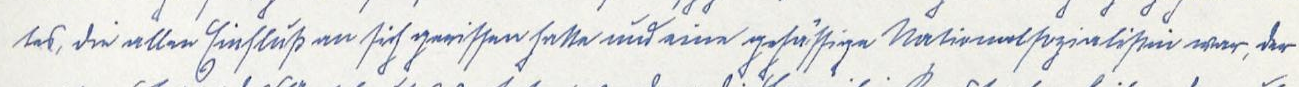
ter, die allen Eifluß an sich gerissen hatte und eine gechässige Nationalsozialistin war, der
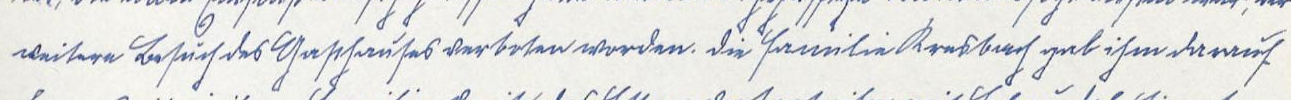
weiteren Besuch des Gasthauses verboten worden. Die Familie Kresbach gab ihm darauf
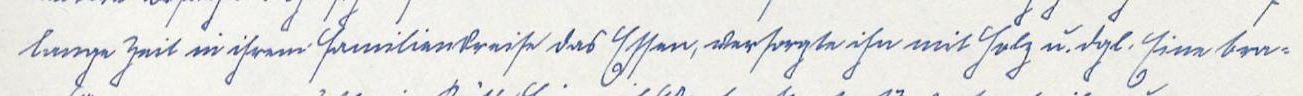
lange Zeit in ihrem Familienkreise das Essen, versorgte ihn mit Holz u. dgl. Eine bra-
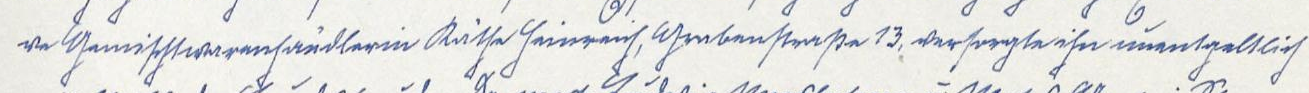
ve Gemischtwarenhändlerin Käthe Heinreich, Grabenstraße 13, versorgte ihn unentgeltlich
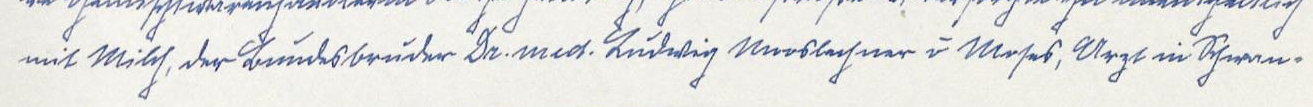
mit Milch, der Bundesbruder, Dr. med. Ludwig Mooslechner v/o Moses, Arzt in Schwan-
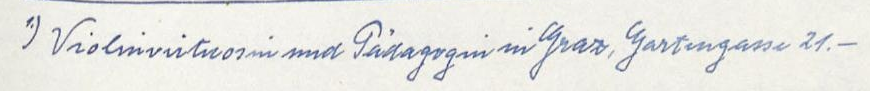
1) Violinvirtuosin und Pädagogin in Graz, Ga.rtengasse 21.
